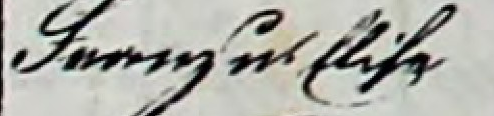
Franz u. Elise
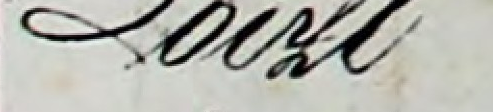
Loizl
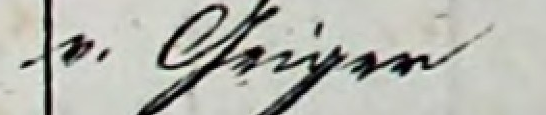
v. Geiger
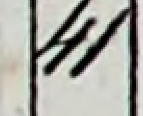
41
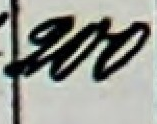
200
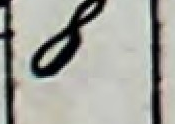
8
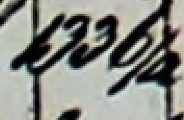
1336/a
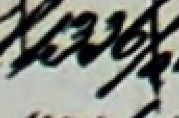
1336/?
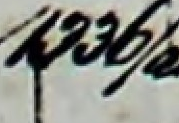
1336/a
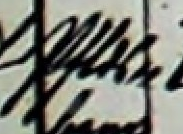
Pflds„
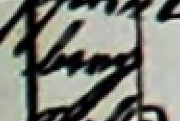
berg
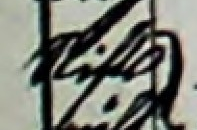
Stifts
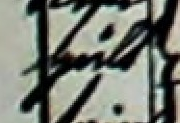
gütt
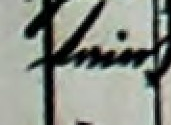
lein
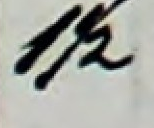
1 1/2
